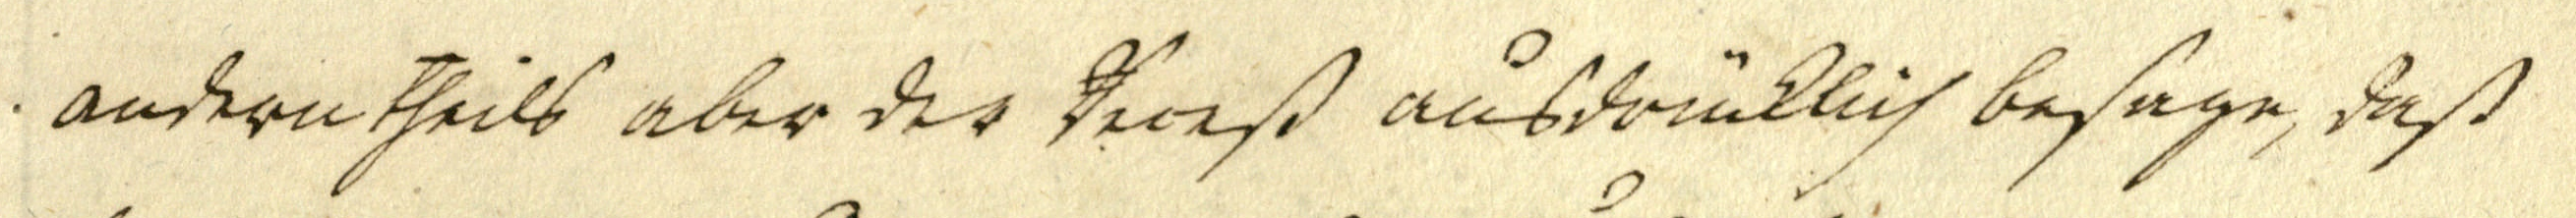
anderntheils aber der Receß ausdrücklich besage, daß
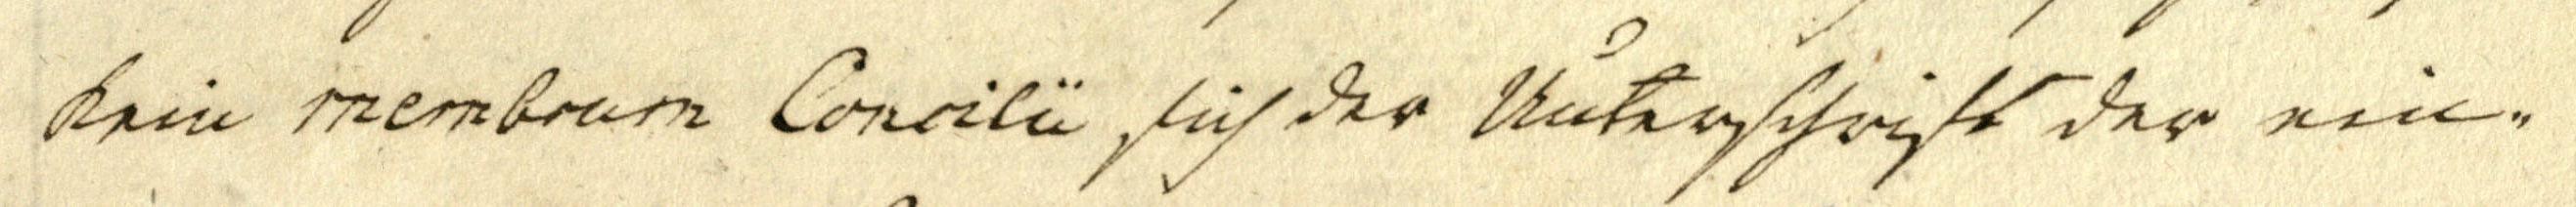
kein membrum Concilii sich der Unterschrift der ein¬
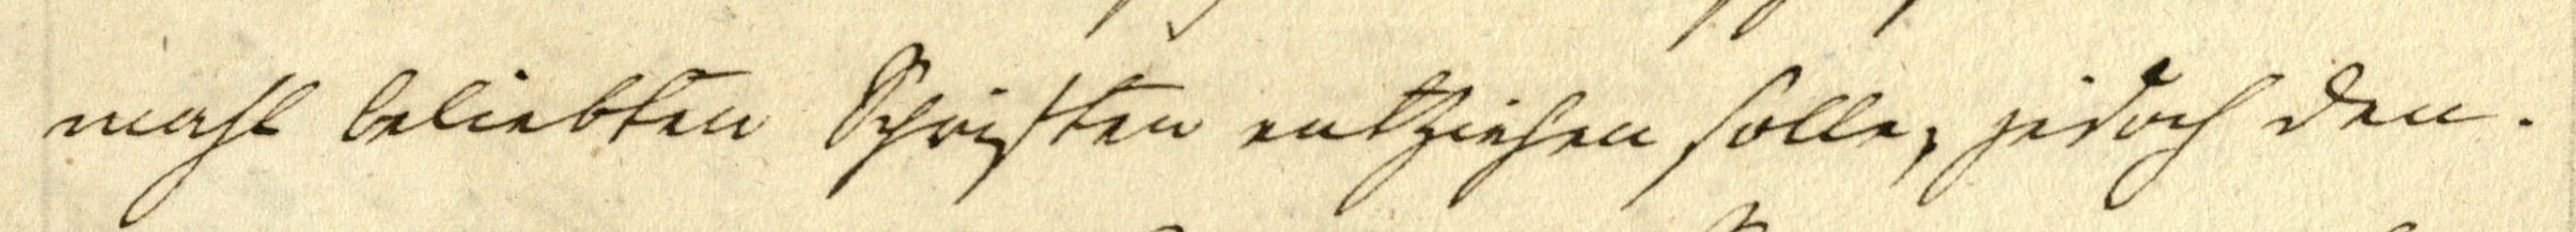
mahl beliebten Schriften entziehen solle, jedoch den¬
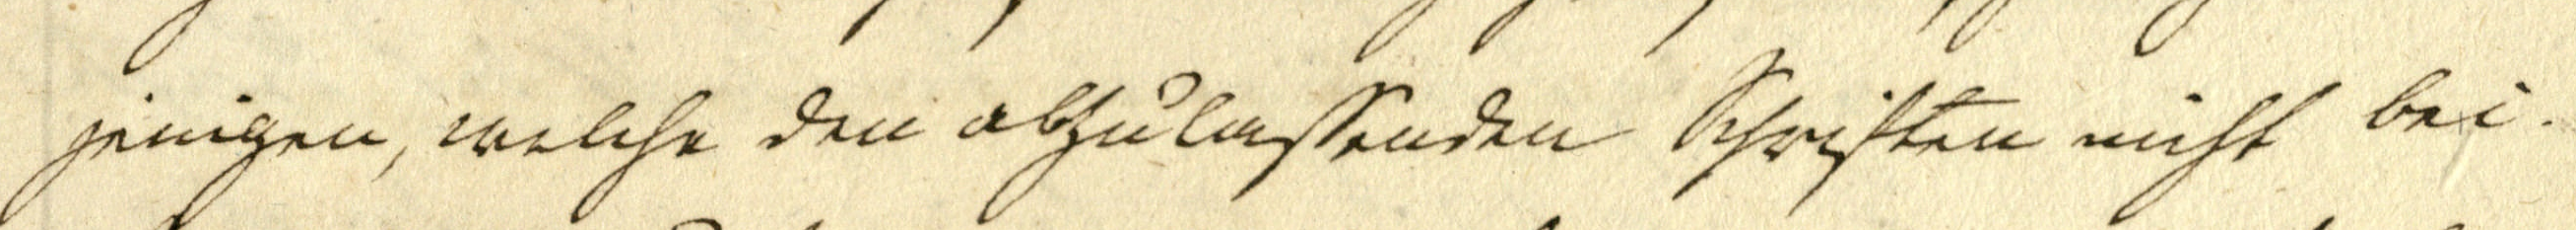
jenigen, welche den abzulassenden Schriften nicht bei¬
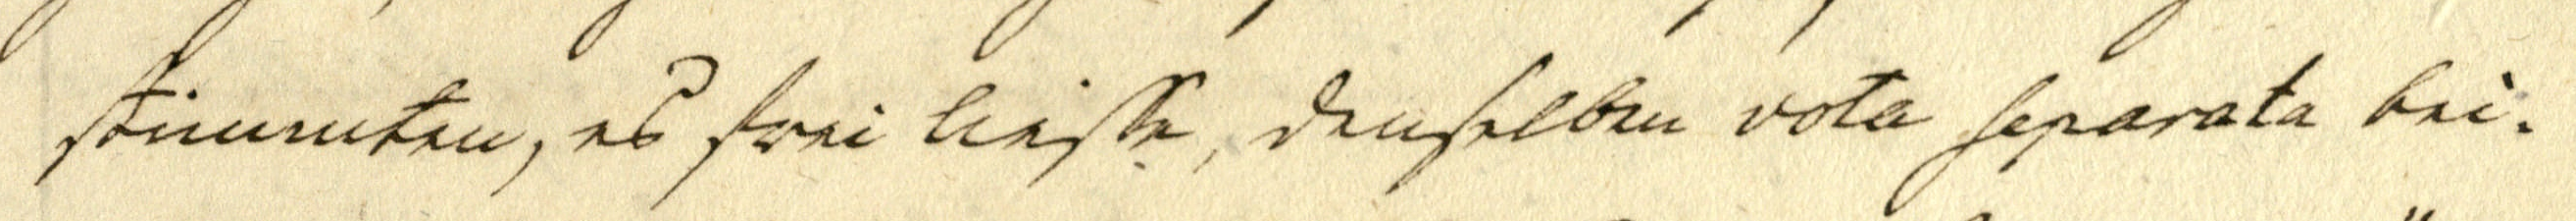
stimmten, es frei liesse, denselben vota separata bei¬
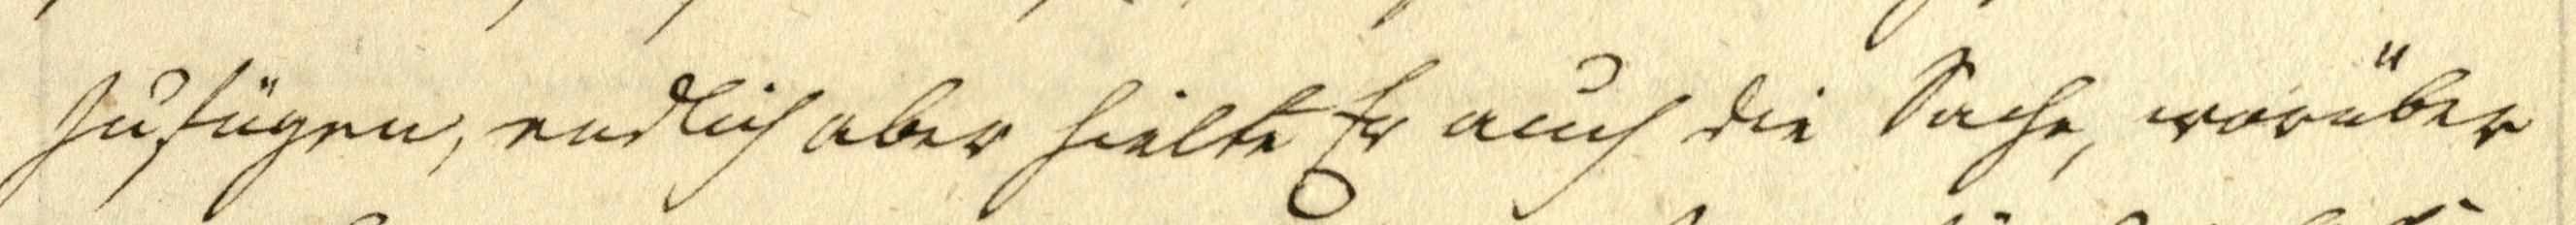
zufügen, endlich aber hielte Er auch die Sache, worüber
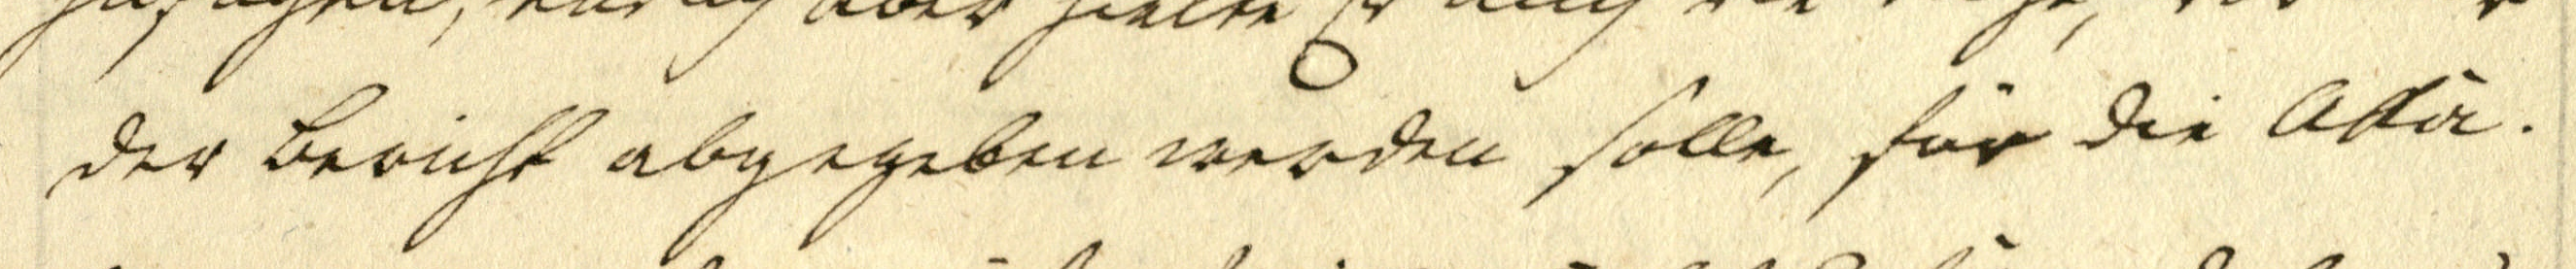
der Bericht abgegeben werden solle, für die Aka¬
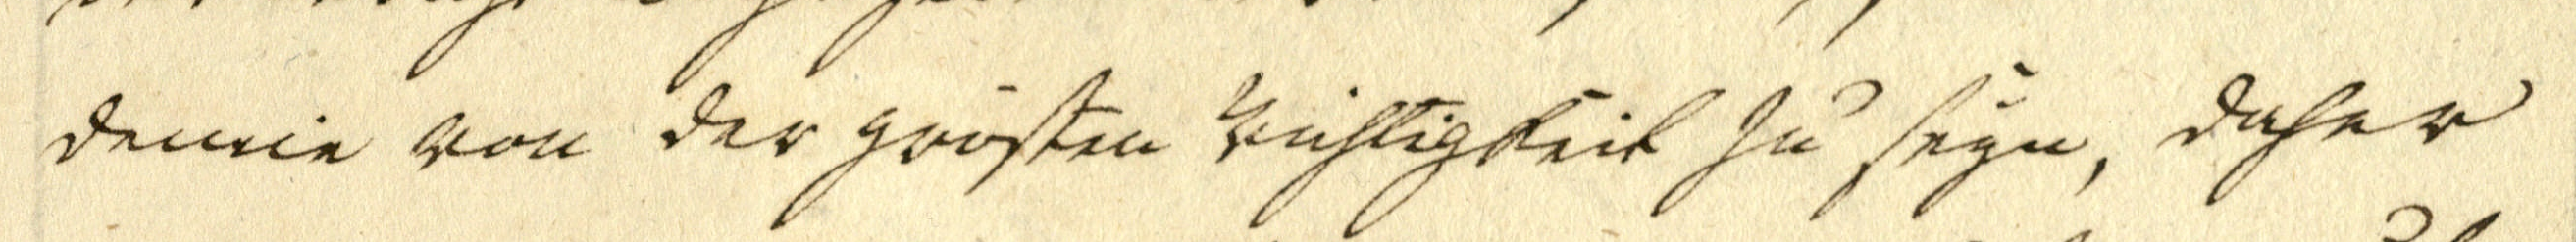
demie von der grösten Wichtigkeit zu seÿn, daher
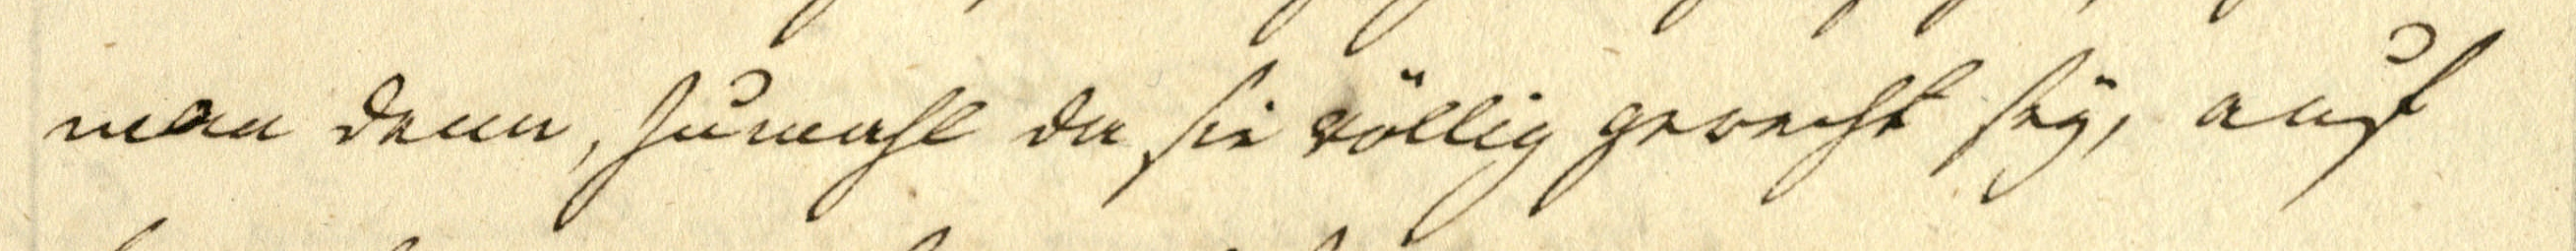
man dann, zumahl da sie völlig gerecht seÿ, auf
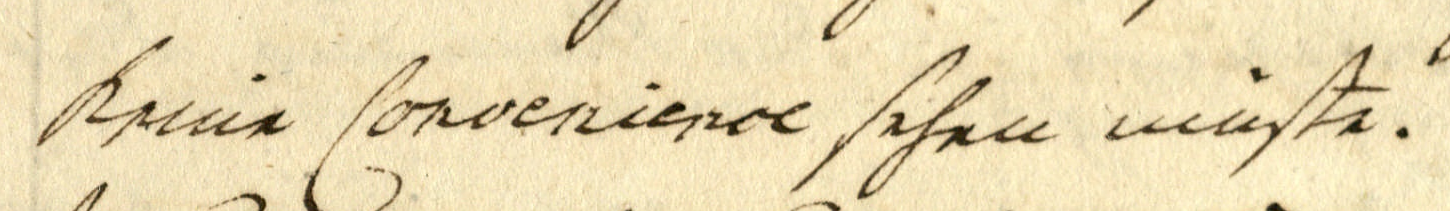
keine Convenience sehen müste.
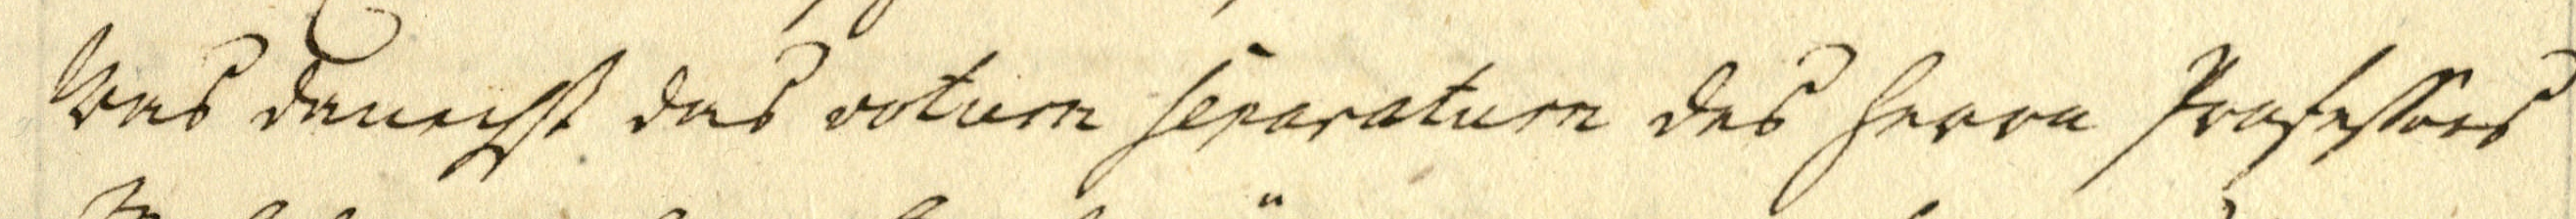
Was danechst das votum des herrn Professor
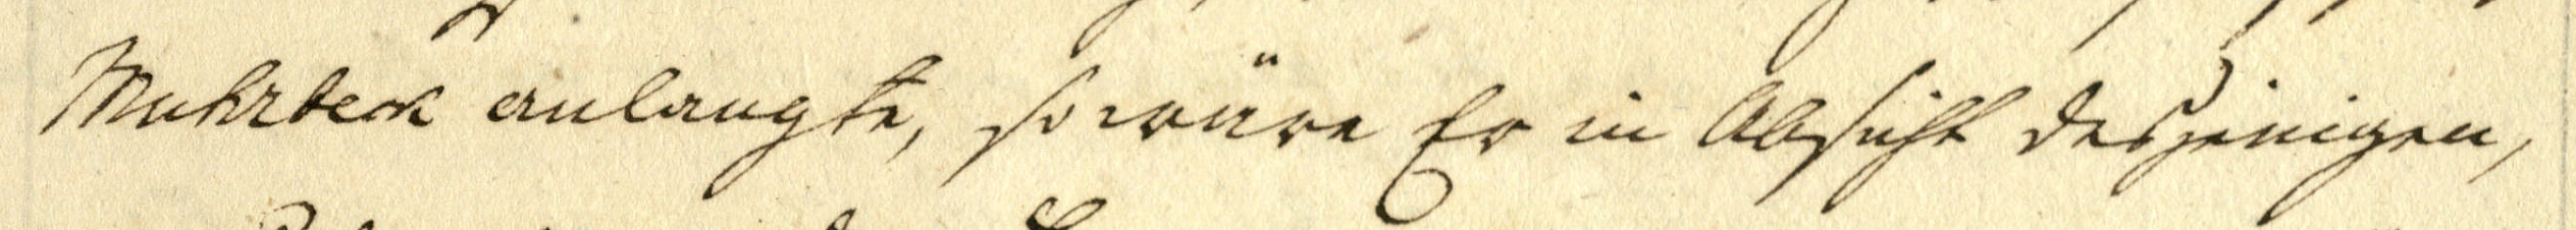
Muhrbeck anlangte, so wäre Er in Absicht desjenigen
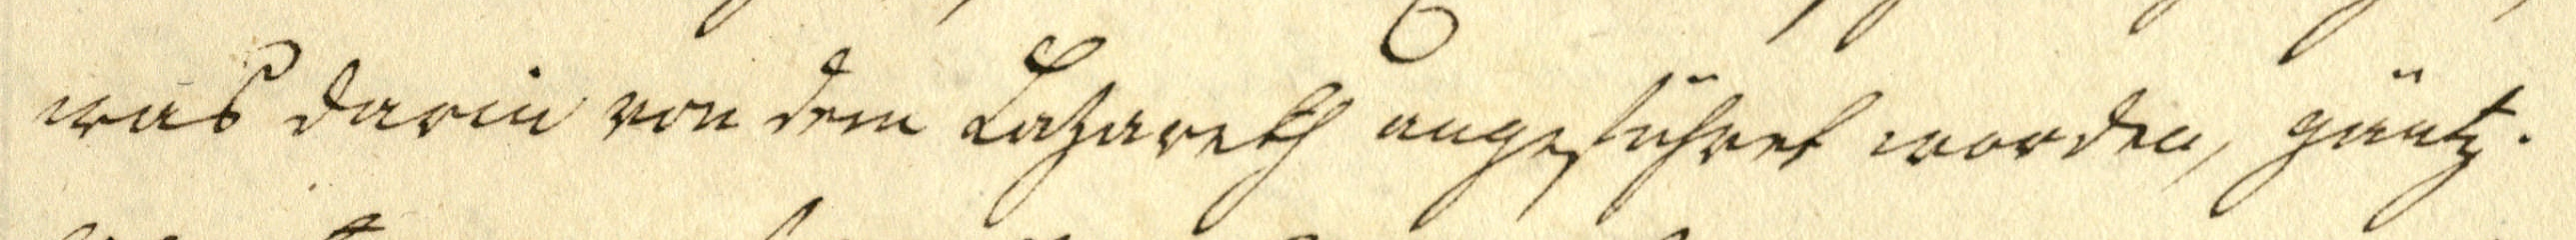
was darin von dem Lazareth angeführet worden, gäntz¬
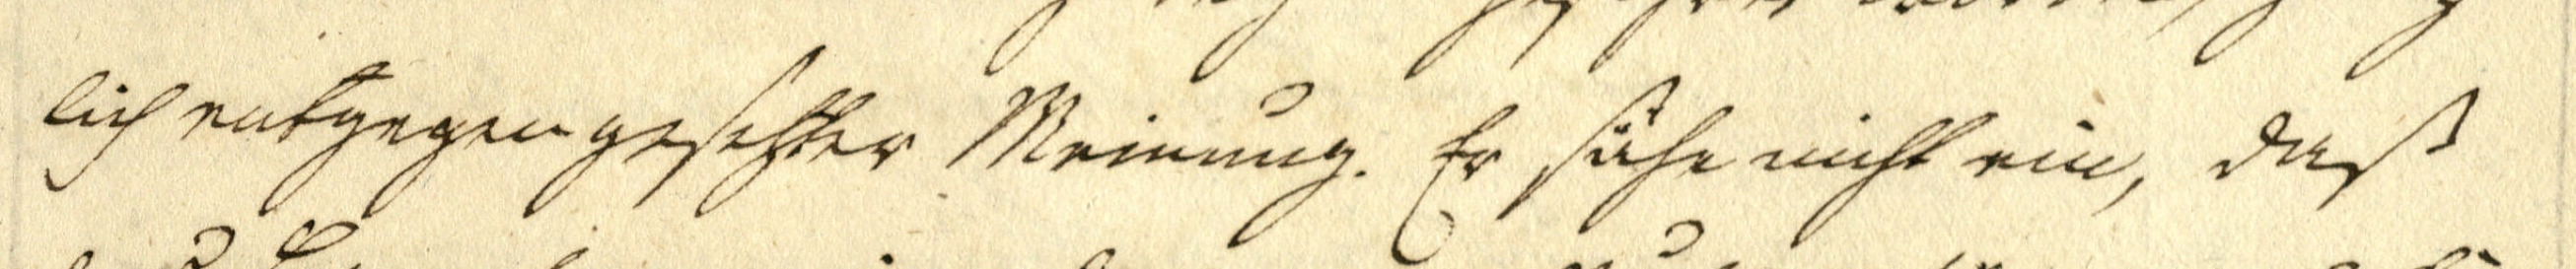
lich entgegengesetzter Meinung. Er sähe nicht ein, daß
